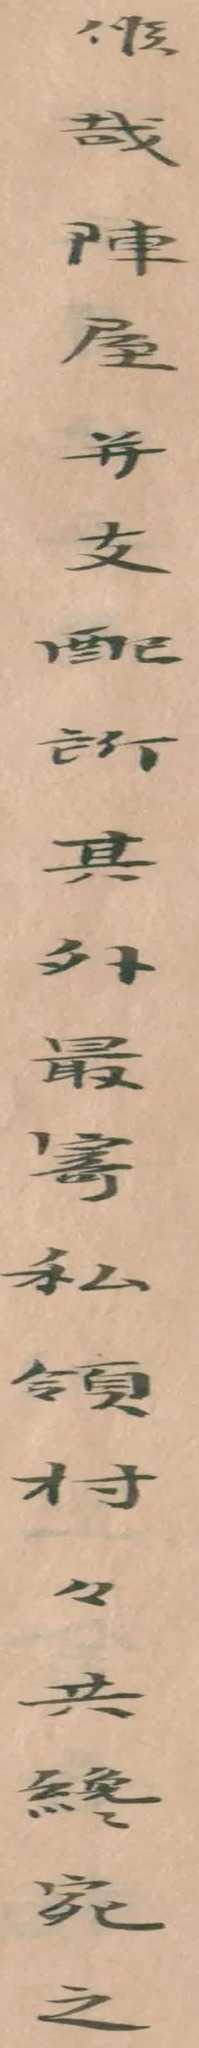候哉陣屋并支配所其外最寄私領村々共纔宛之
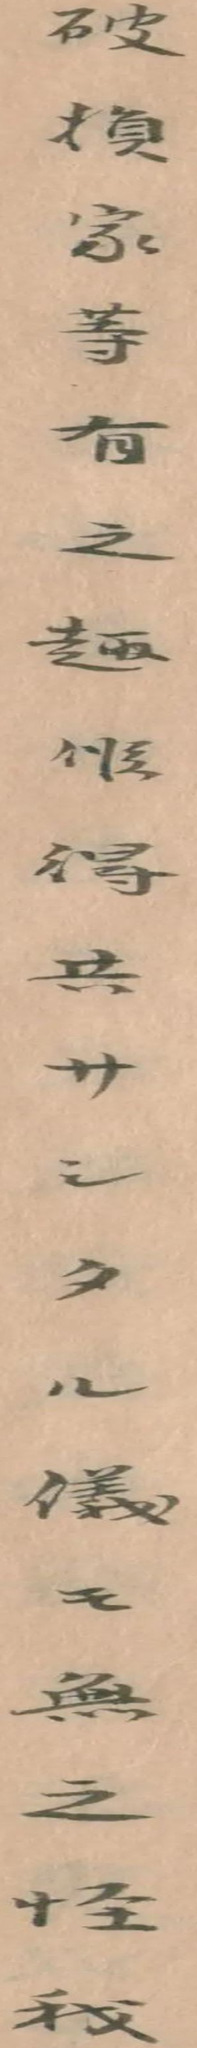破損家等有之趣候得共サシタル儀モ無之怪我

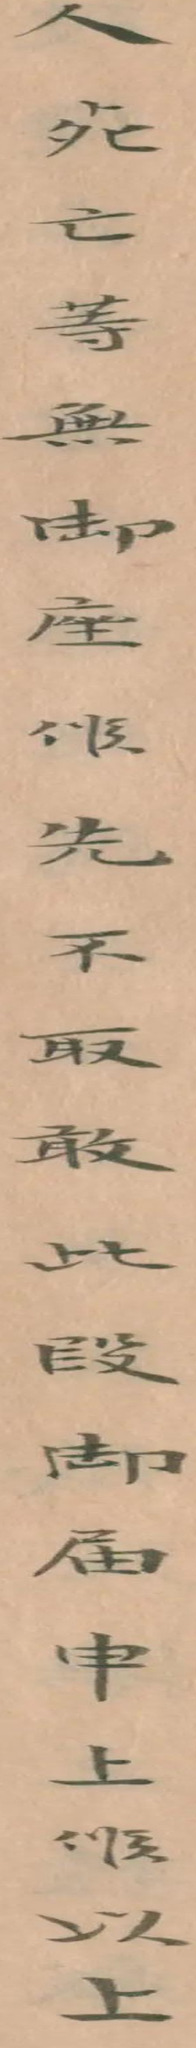人死亡等無御座候先不取敢此段御届申上候以上
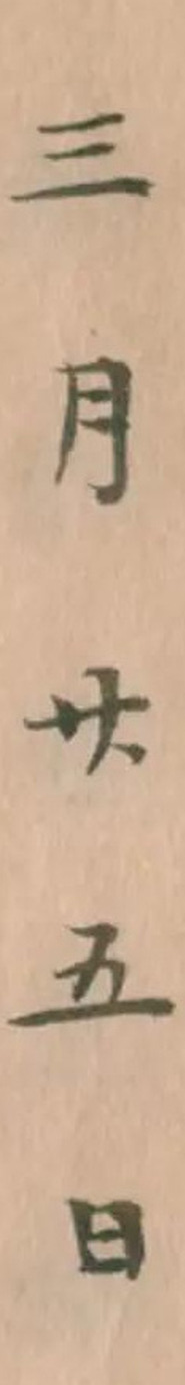三月廿五日
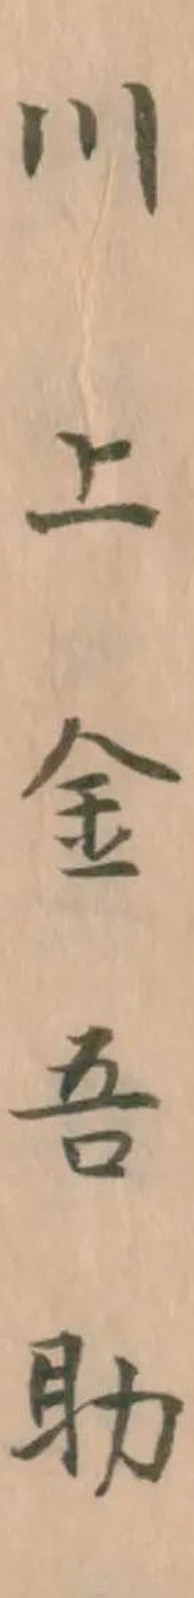川上金吾助
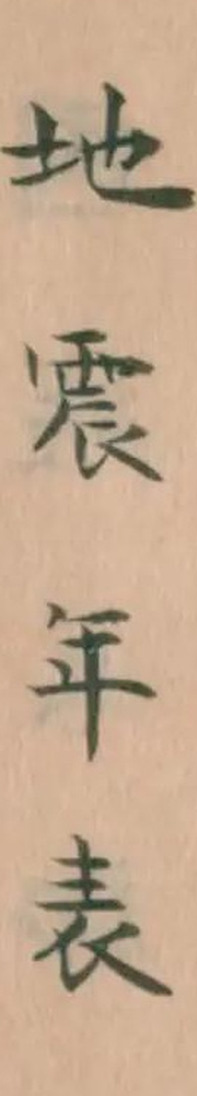地震年表
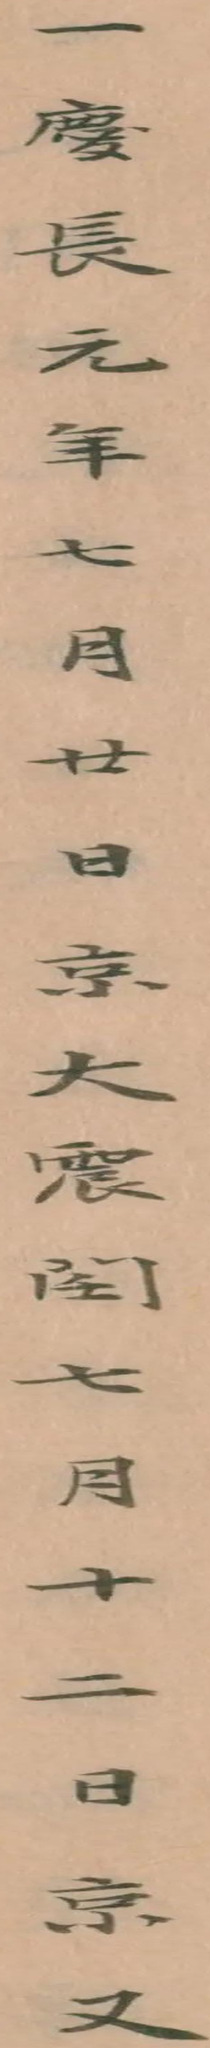一慶長元年七月廿四日京大震閏七月十二日京又
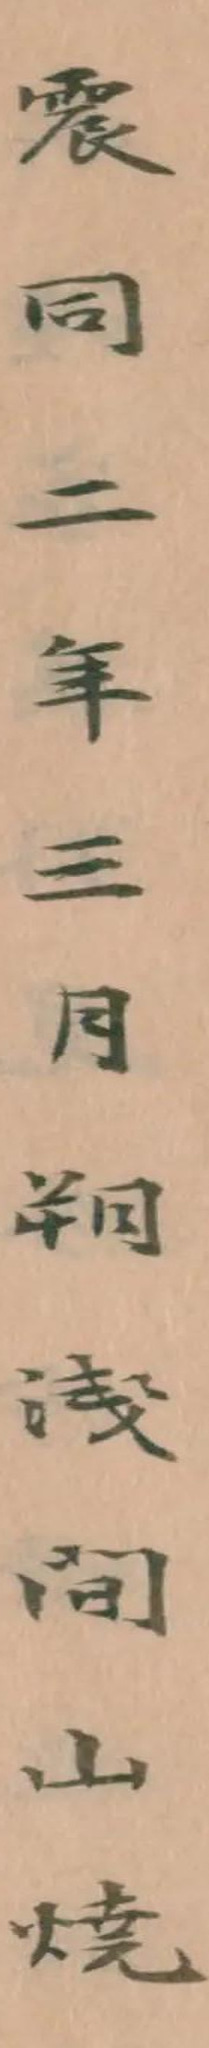震同二年三月朔浅間山焼
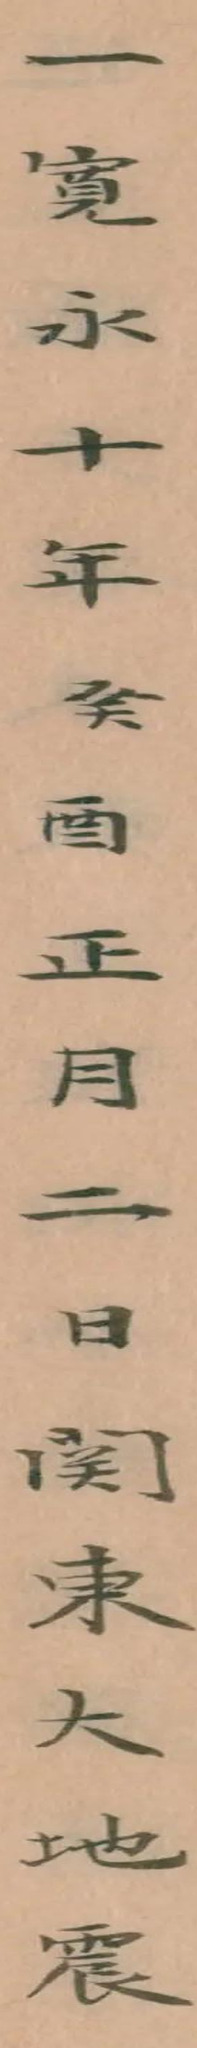一寛永十年癸酉正月二日関東大地震
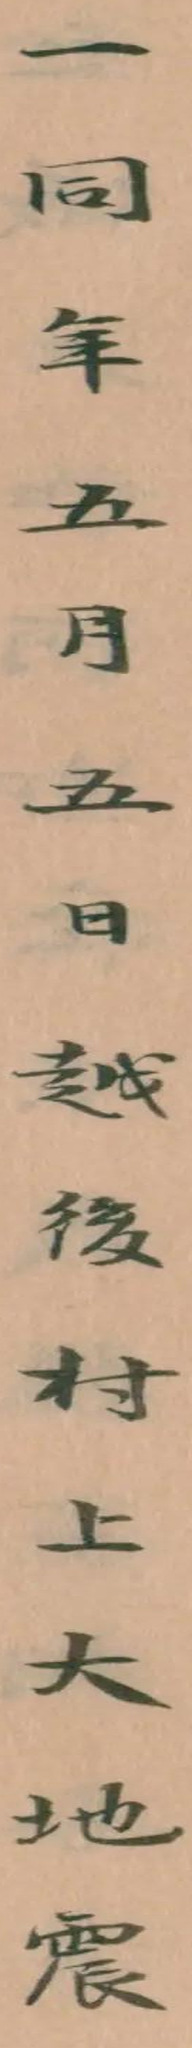一同年五月五日越後村上大地震
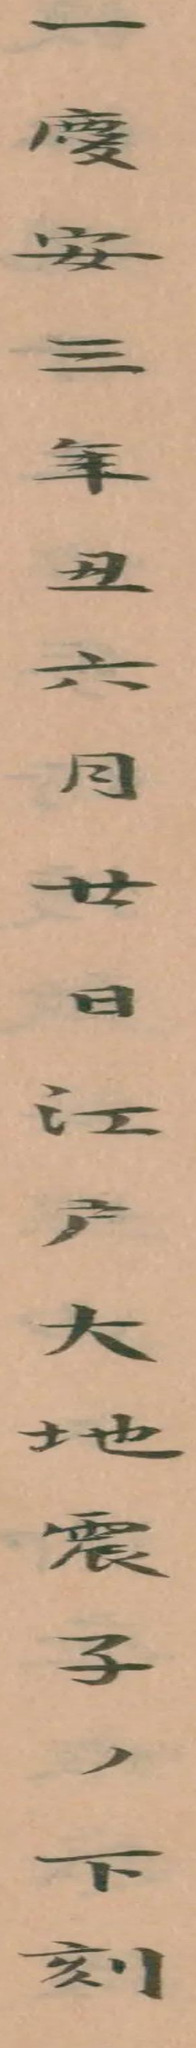一慶安三年丑六月廿日江戸大地震子ノ下刻
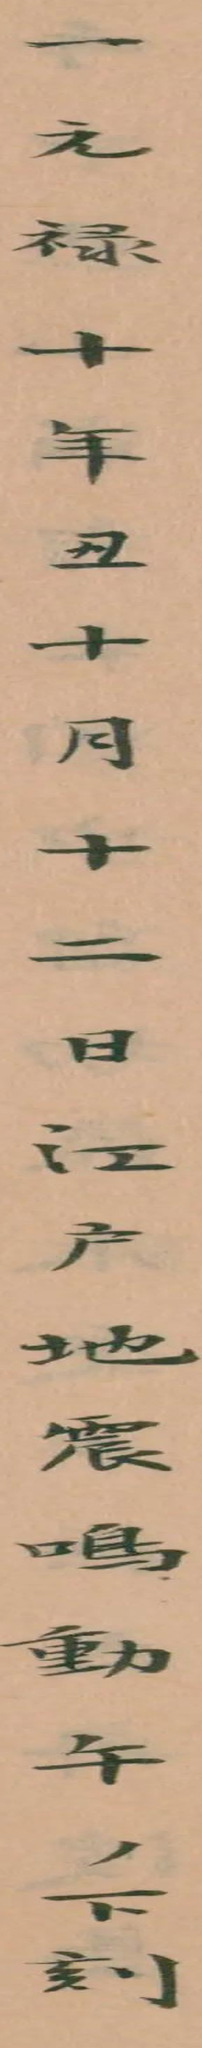一元禄十年丑十月十二日江戸地震鳴動午ノ下刻
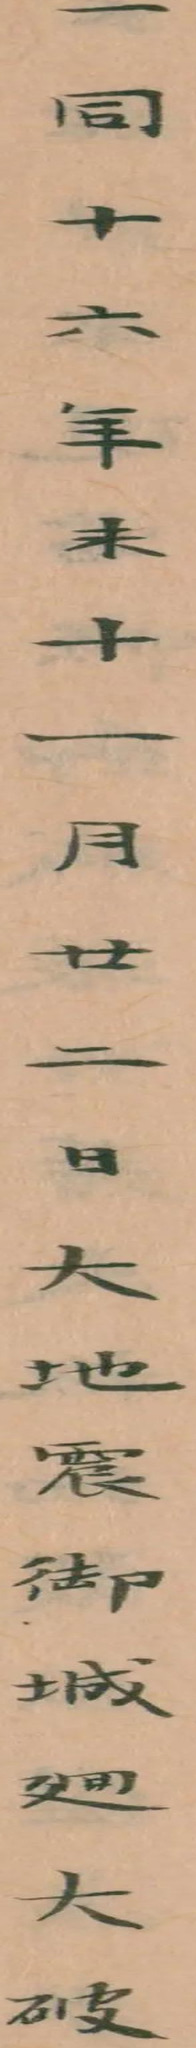一同十六年未十一月廿二十二日大地震御城廻大破
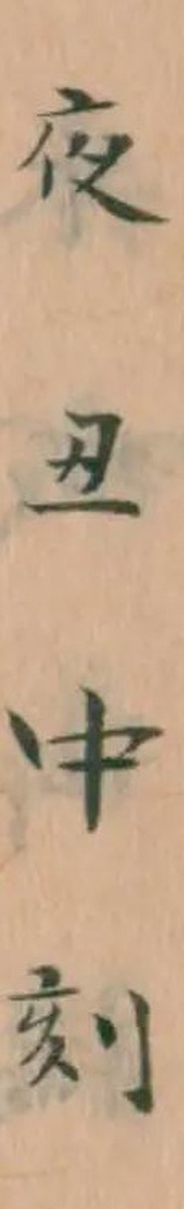夜丑中刻
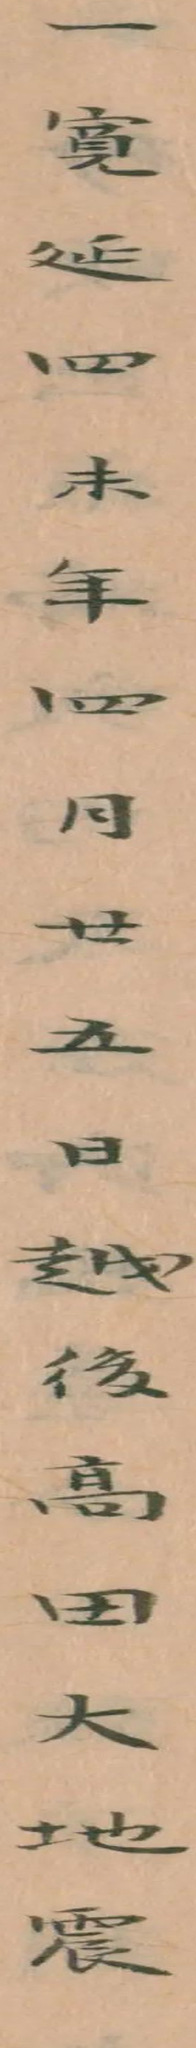一寛延四未年四月廿五日越後高田大地震
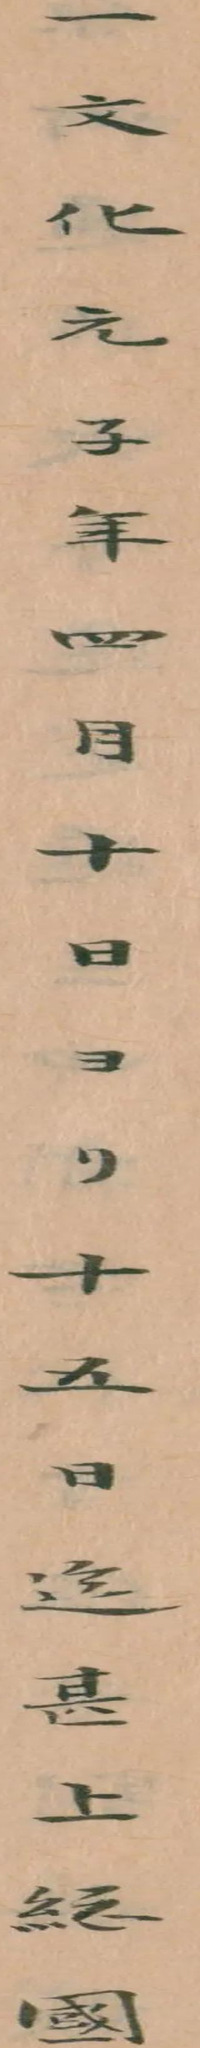一文化元子年四月十日ヨリ十五日迄甚上総国
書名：地災撮要. 巻1(噴火山・地震ノ部)
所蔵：国立国会図書館 National Diet Library, JAPAN
